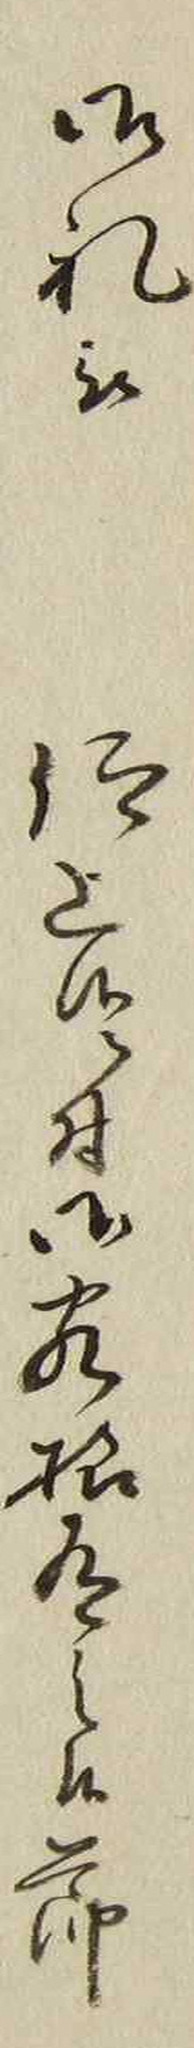御礼被仰上候ニ付御客様有之候節
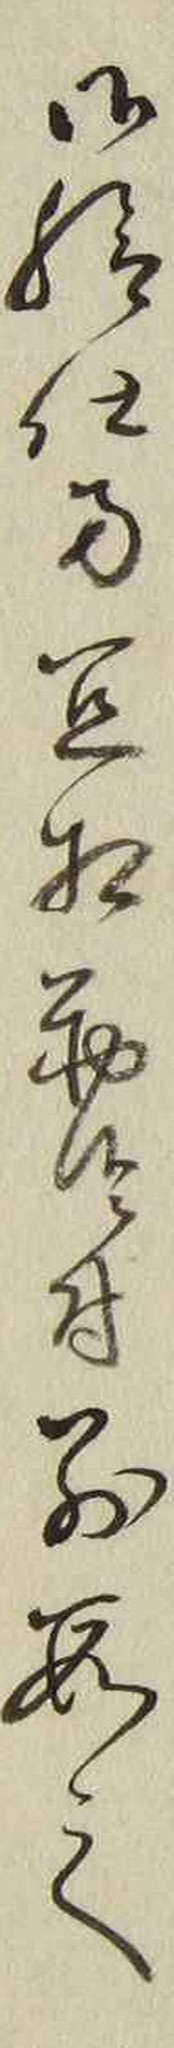御賄仕方宜相勤候ニ付別段之

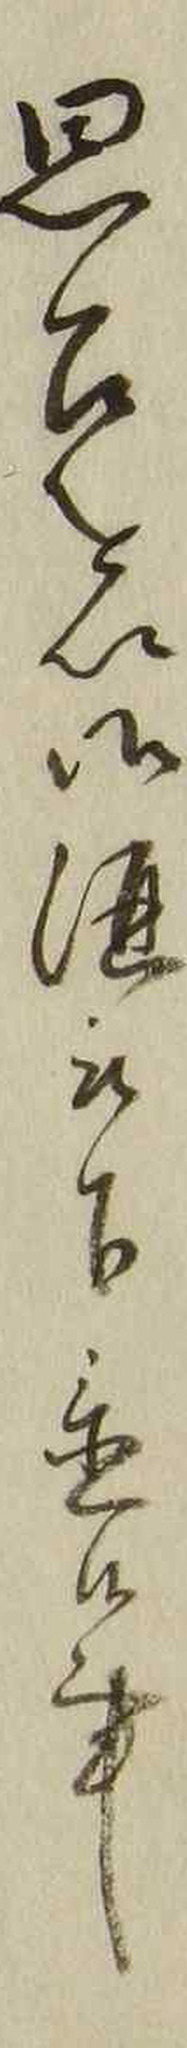思召を以御酒被下置候事
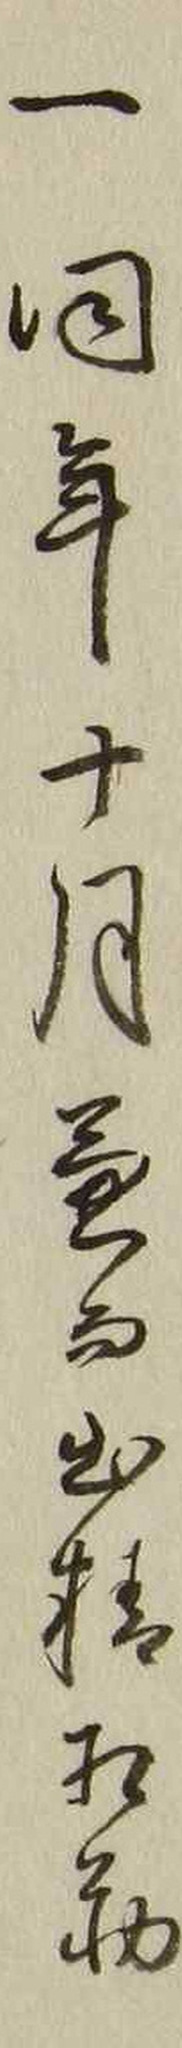一同年十月兼而出精相勤
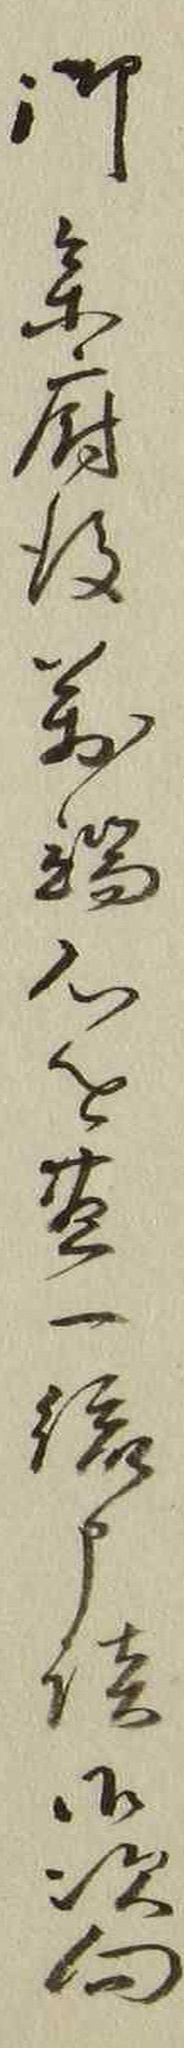御参府役万端心を尽一統申談御次向
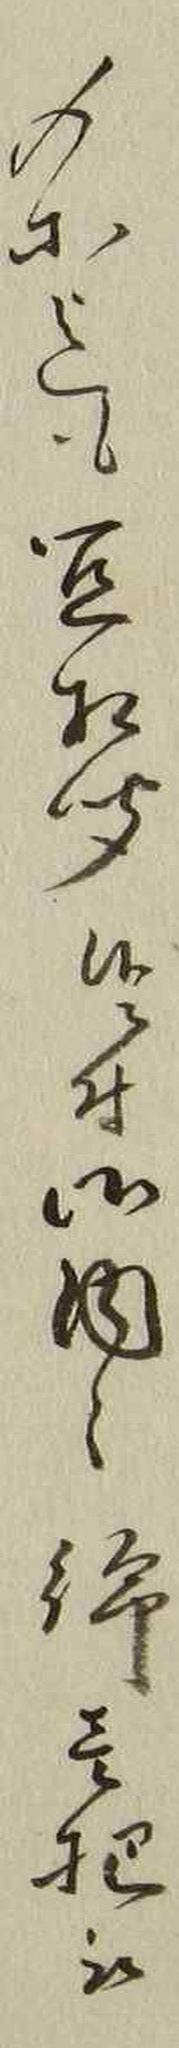〆等迄も宜相聞候ニ付御内々綿壱把被
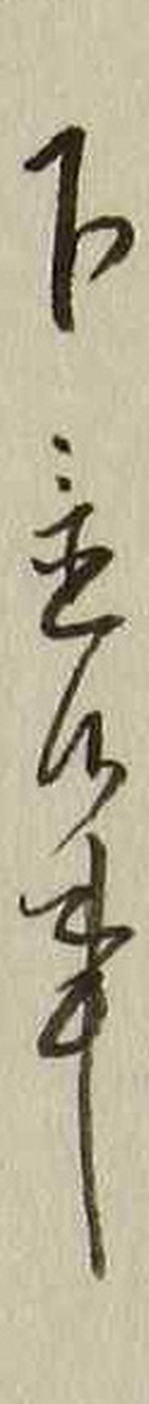下置候事
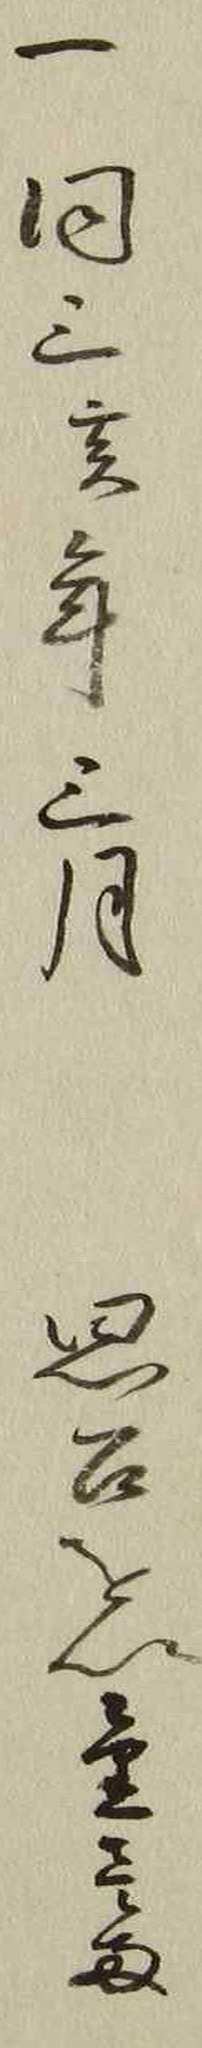一同三亥年三月思召を以金壱両
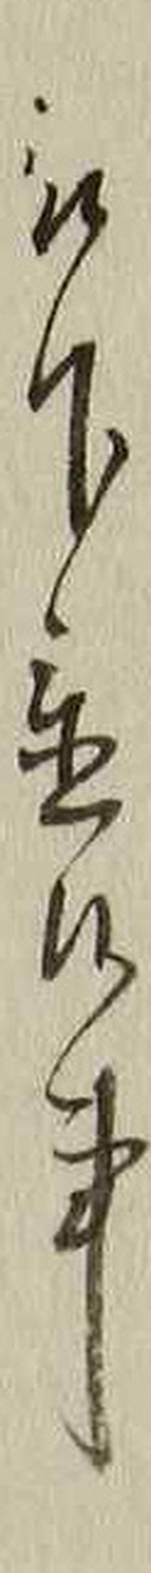被下置候事
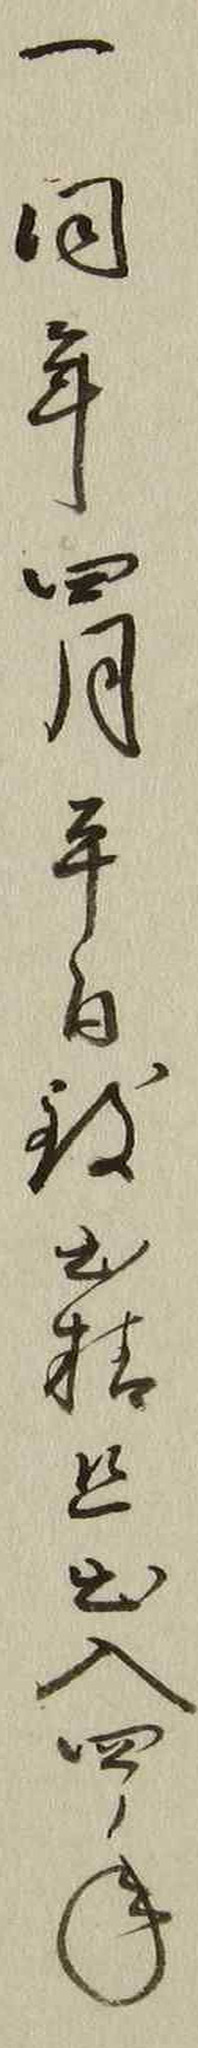一同年四月平日致出精且出入四年
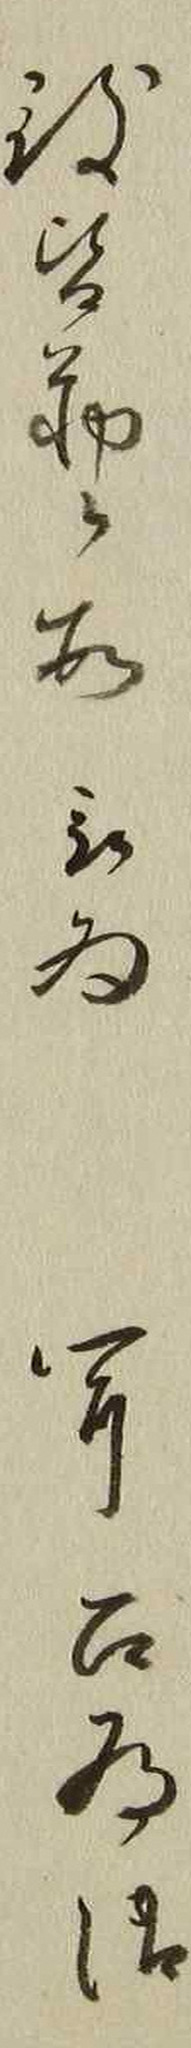致皆勤候段被為聞召為御
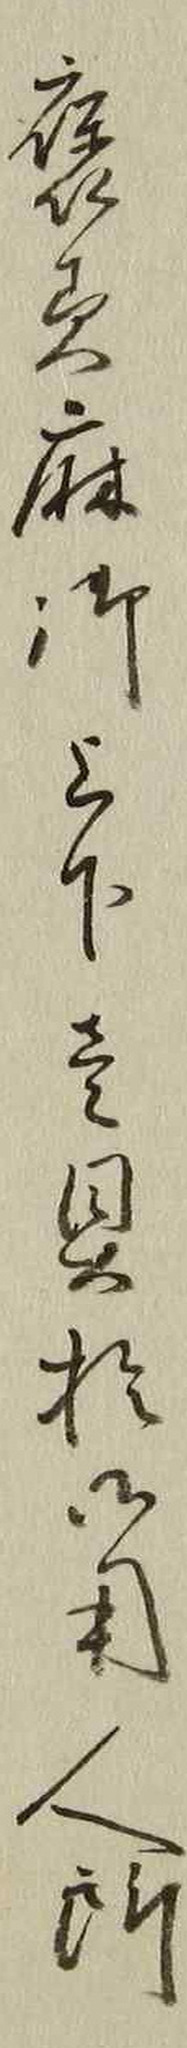褒美麻御上下壱具於御用人所
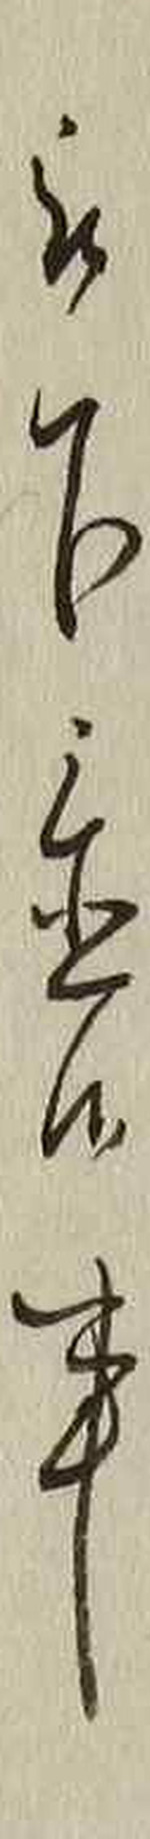被下置候事
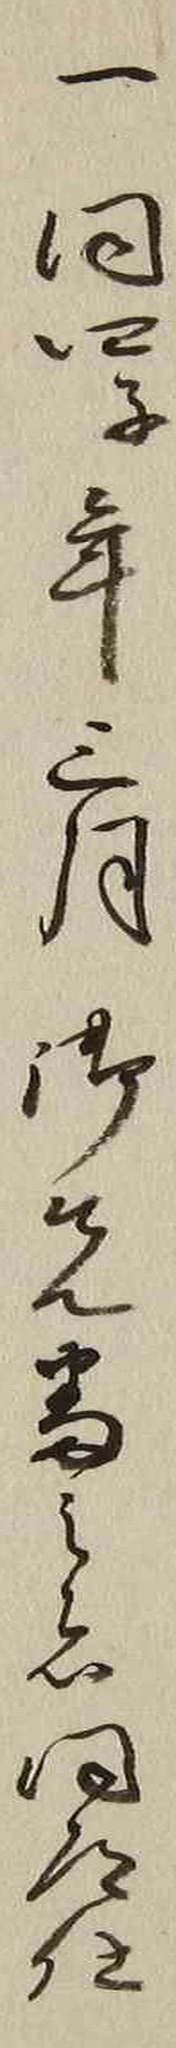一同四子年三月御先番之者同道仕
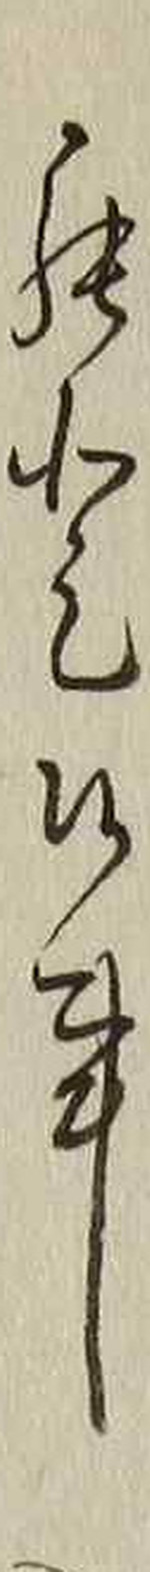罷登候事
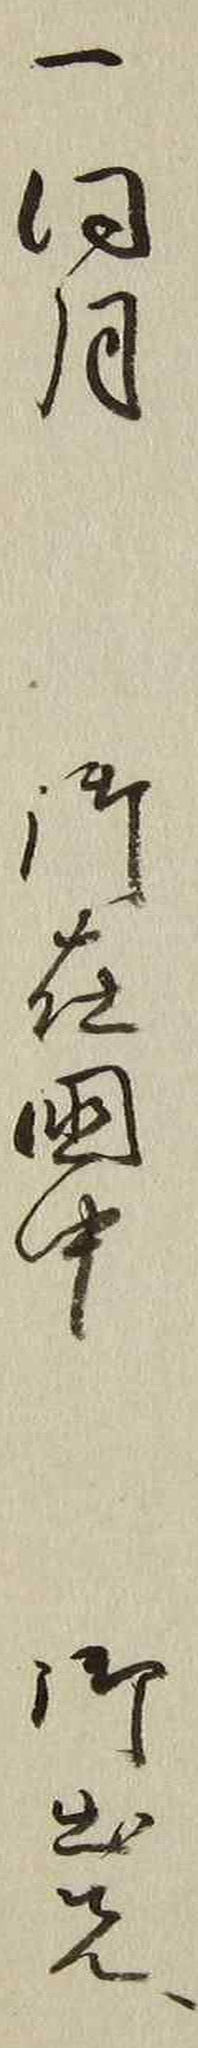一同月御在国中御出先へ
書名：諸士系譜　巻之4　い之部4
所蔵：会津若松市立会津図書館
